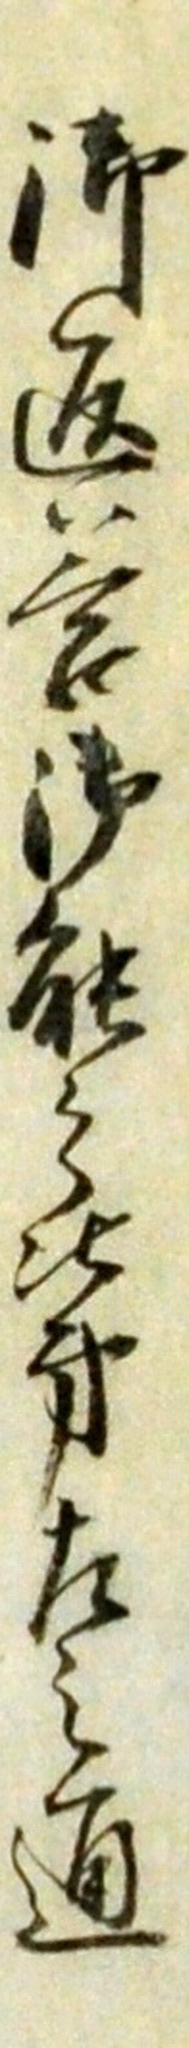御返答御能之次第左之通
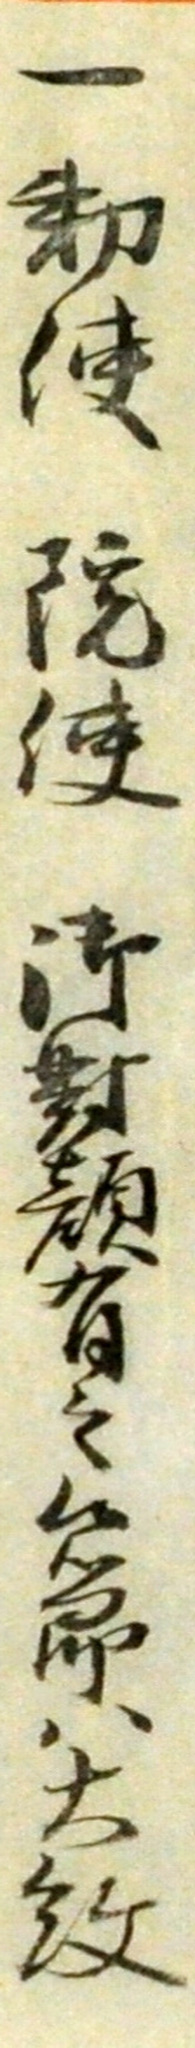一勅使院使御対顔有之候節は大紋
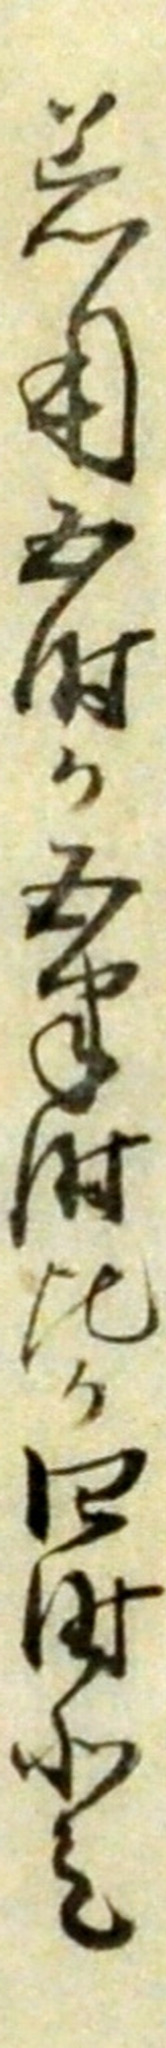着用五時か五半時比か四時登
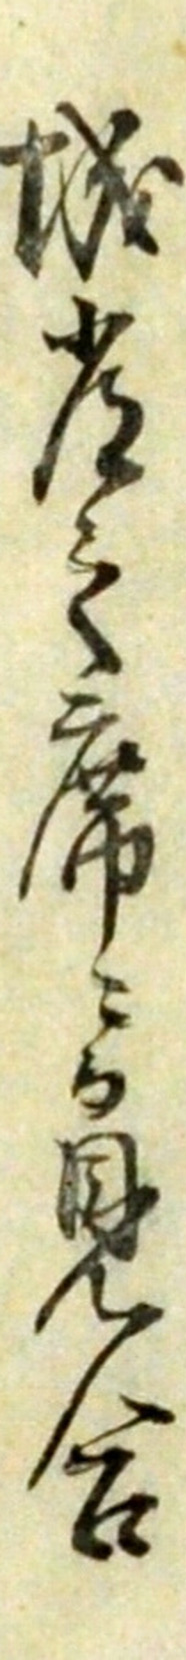城常之席にて見合
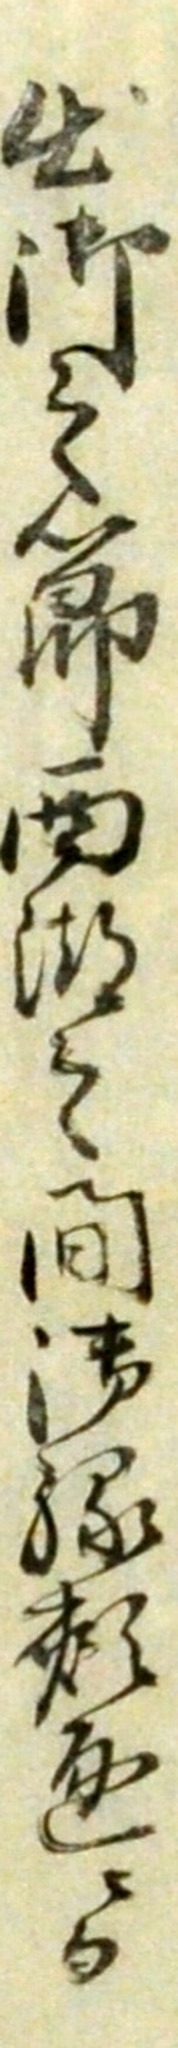出御之節西湖之間御縁頬通にて
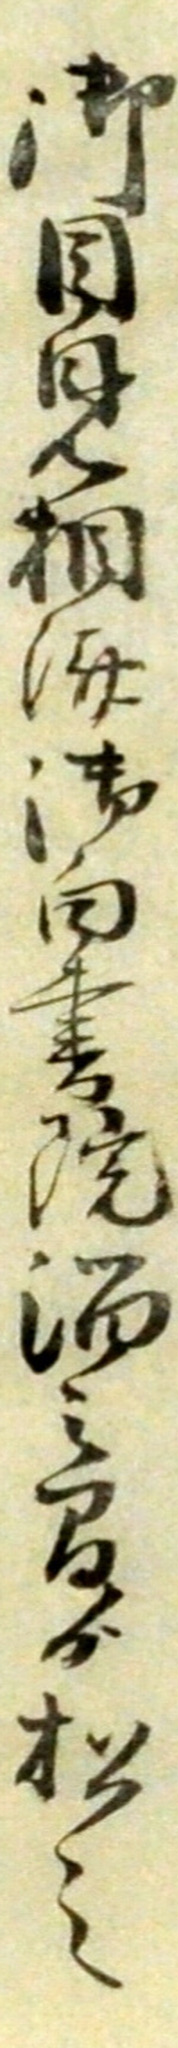御目見相済御白書院溜之間ゟ松之
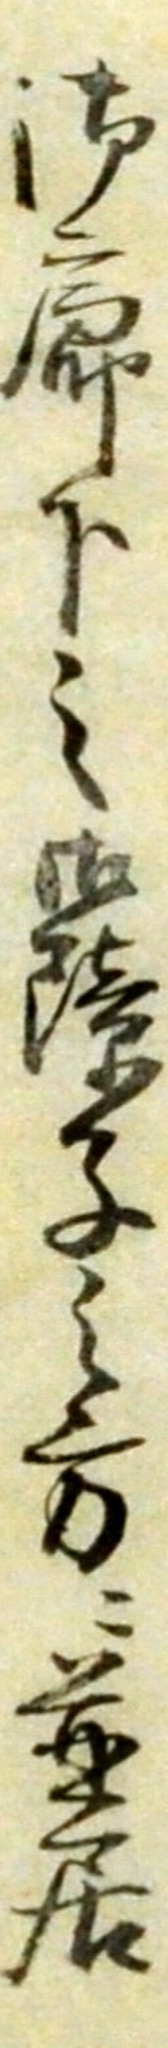御廊下之御障子之方に並居
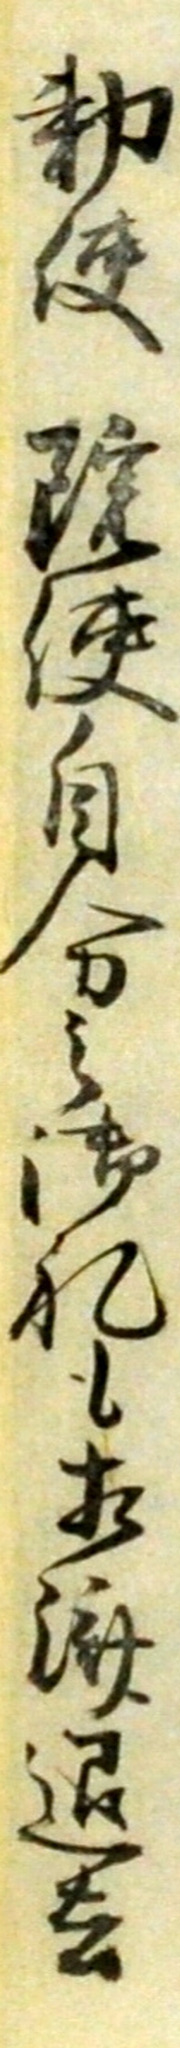勅使院使自分之御礼も相済退去
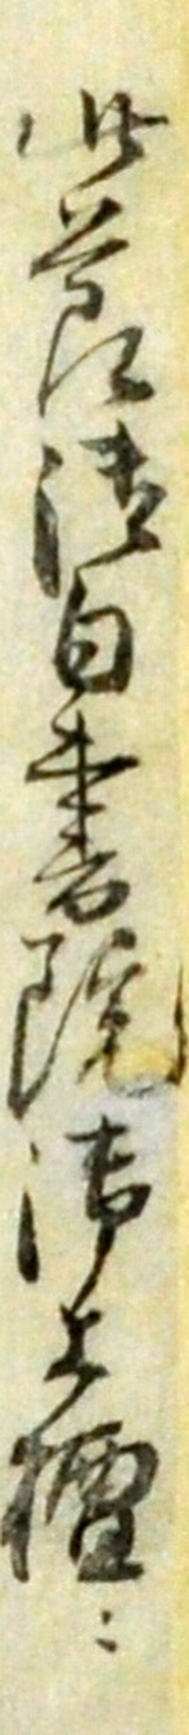此節御白書院御上壇に
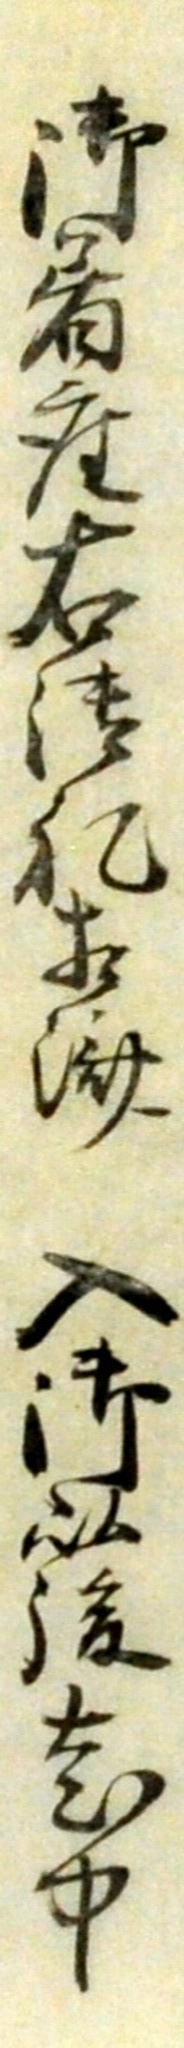御着座右御礼相済入御以後老中
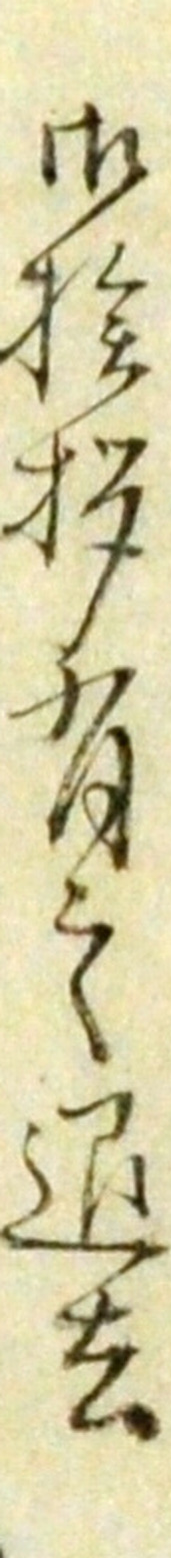御挨拶有之退去

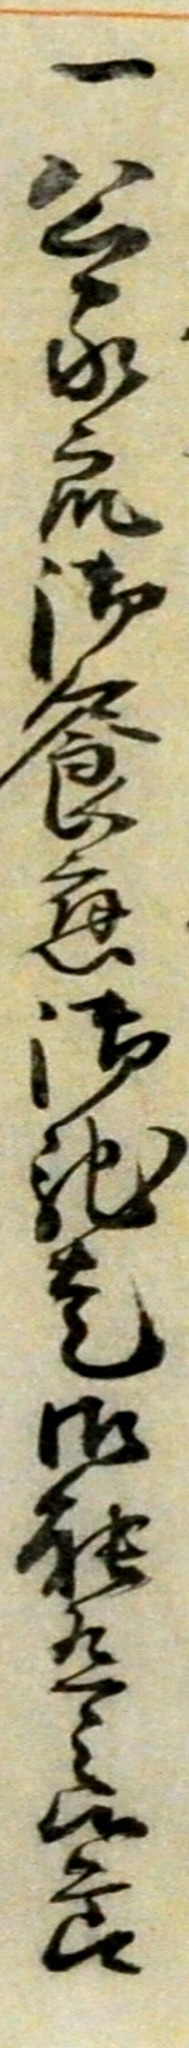一公家衆御饗応御馳走御能有之候節
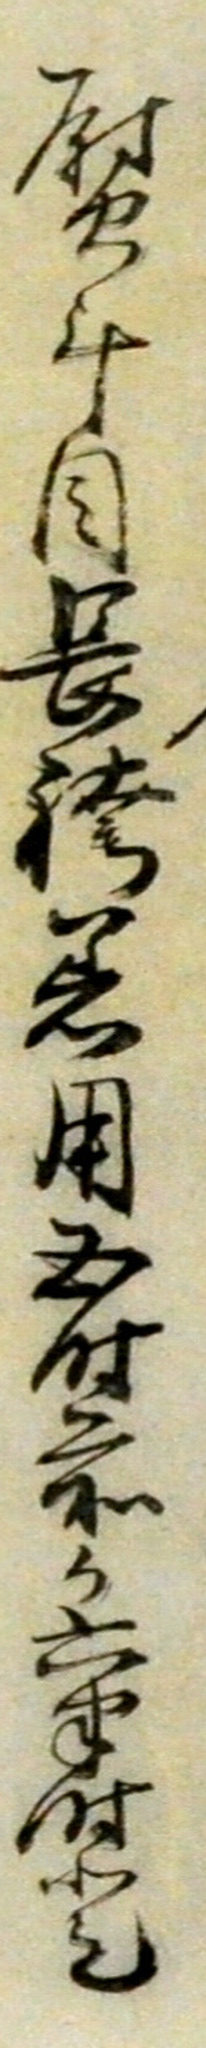熨斗目長袴着用五時前か六半時登
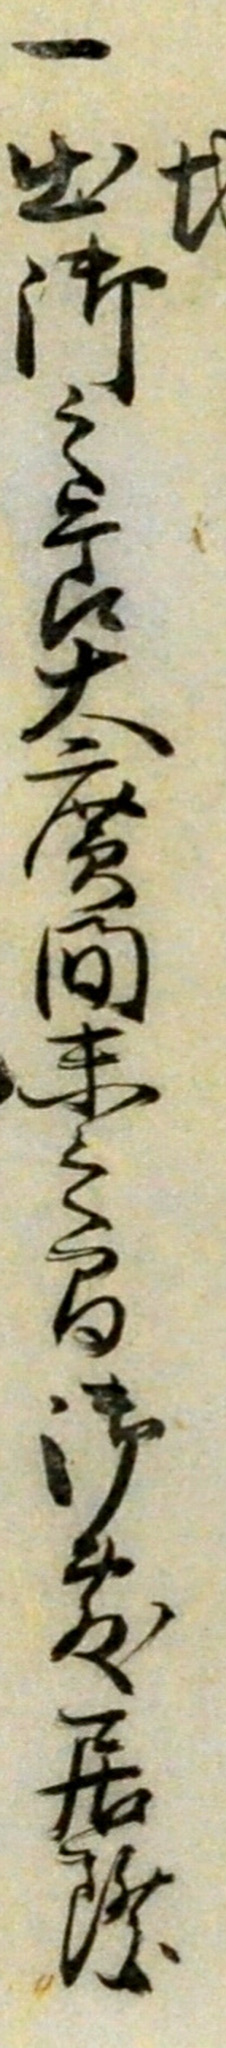一出御之節大広間末之間御敷居際
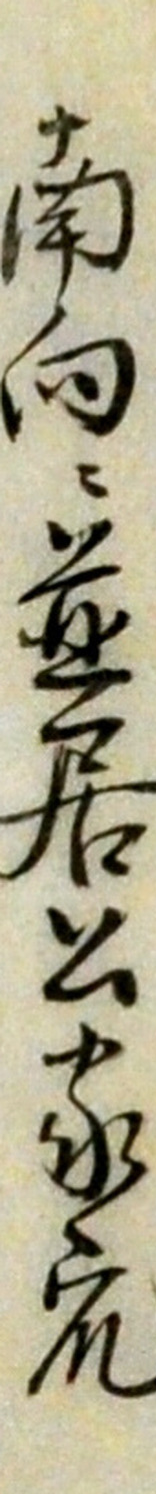南向に並居公家衆
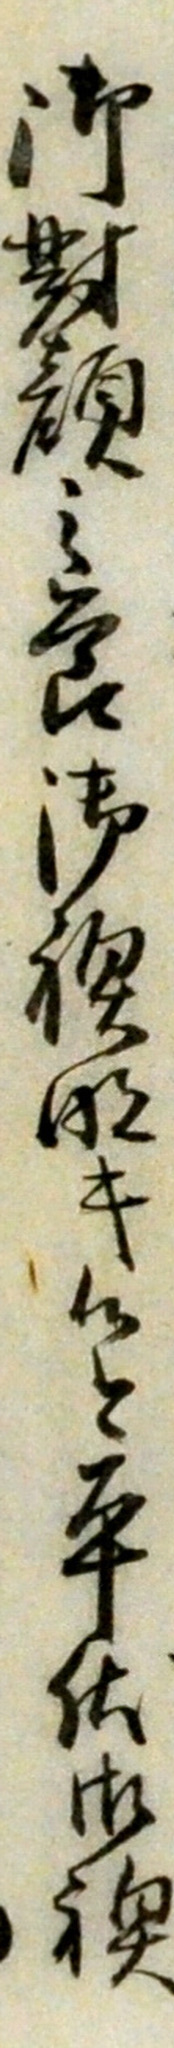御対顔之節御襖明キ候と平伏御襖
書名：申合帳〔一括〕
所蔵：伊那市立高遠町図書館・合同会社AMANE
